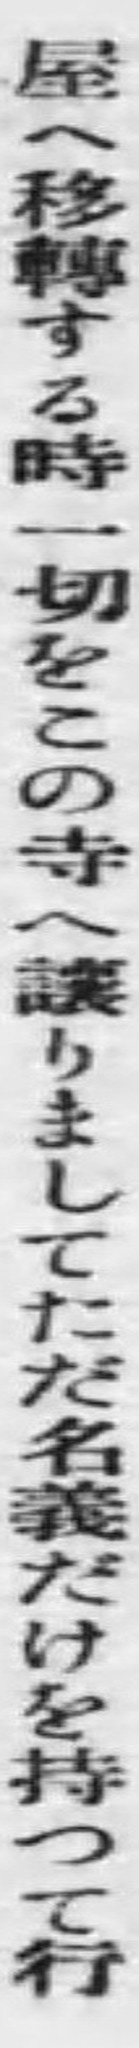屋へ移転する時一切をこの寺へ譲りましてただ名義だけを持つて行
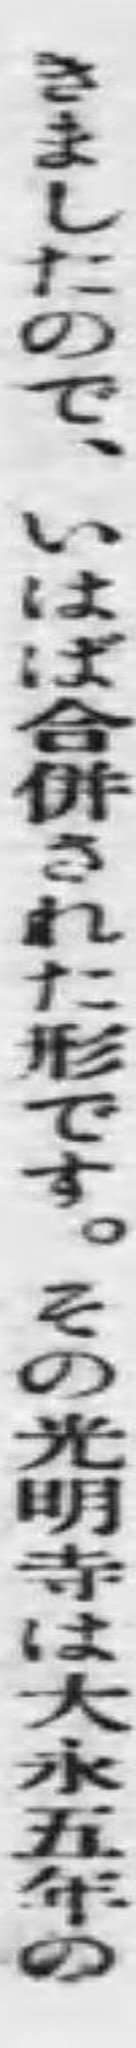きましたので、いはば合併された形です。その光明寺は大永五年の
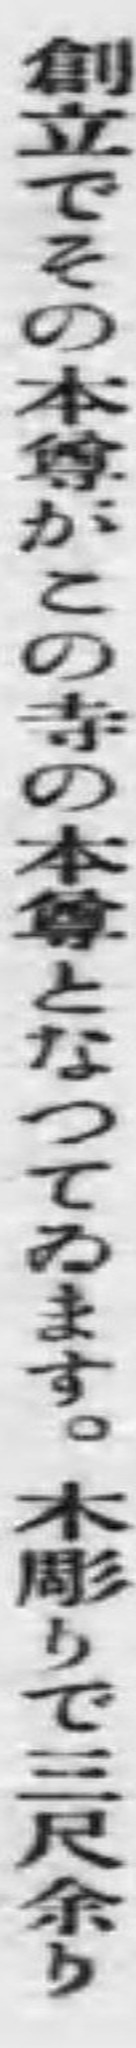創立でその本尊がこの寺の本尊となつてゐます。木彫りで三尺余り
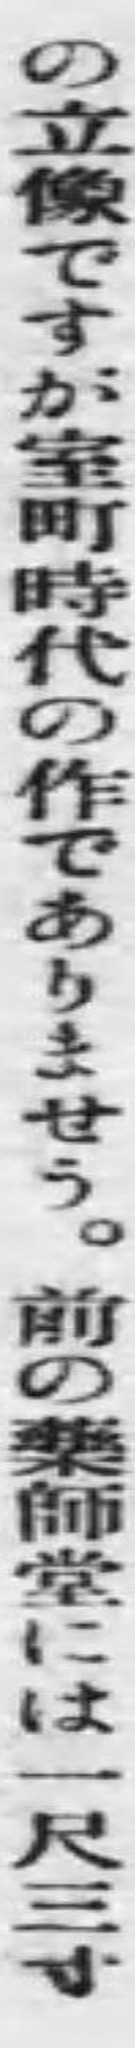の立像ですが室町時代の作でありませう。前の薬師堂には一尺三寸
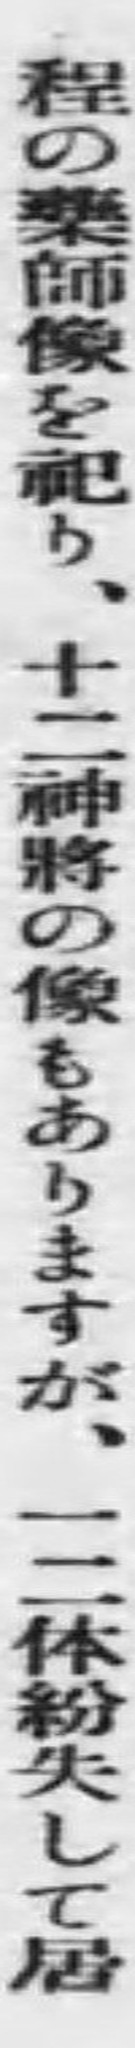程の薬師像を祀り、十二神将の像もありますが、一二体紛失して居
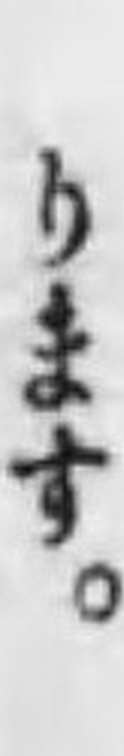ります。
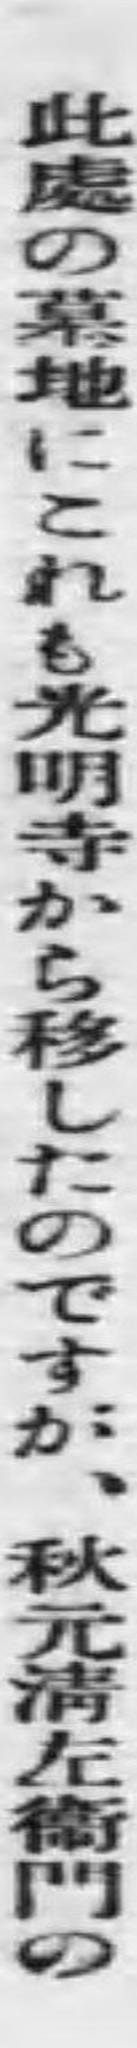此処の墓地にこれも光明寺から移したのですが、秋元清左衛門の
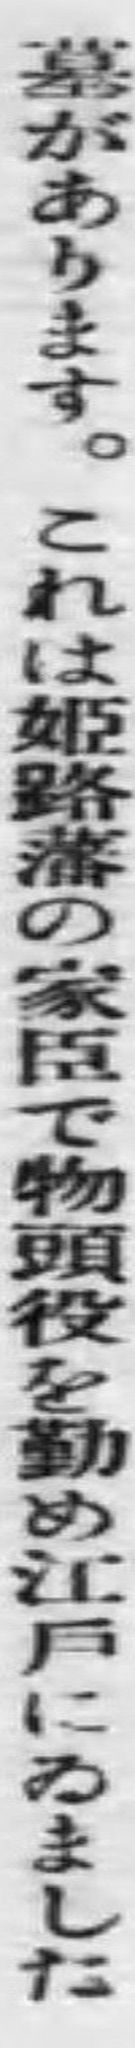墓があります。これは姫路藩の家臣で物頭役を勤め江戸にゐました
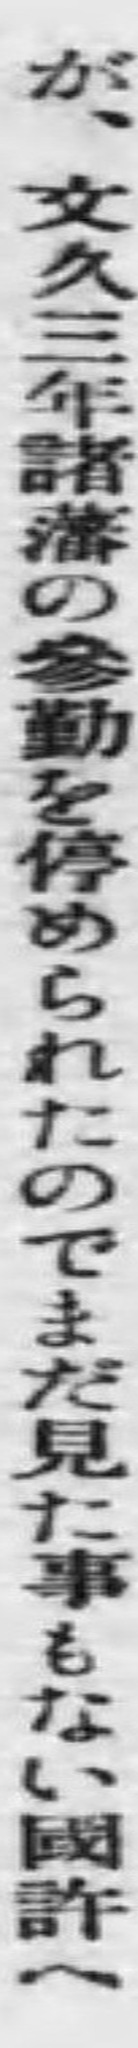が、文久三年諸藩の参勤を停められたのでまだ見た事もない国許へ
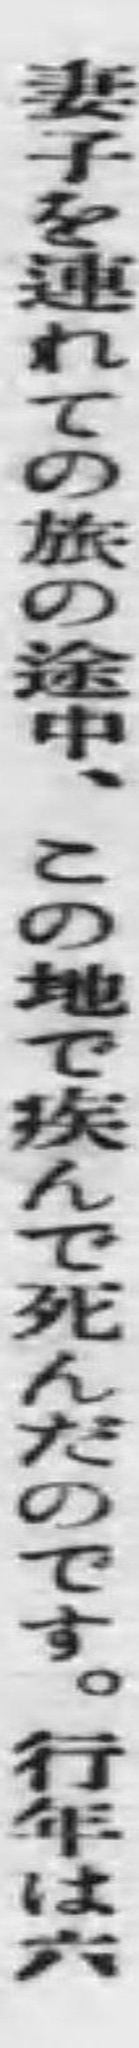妻子を連れての旅の途中、この地で疾んで死んだのです。行年は六
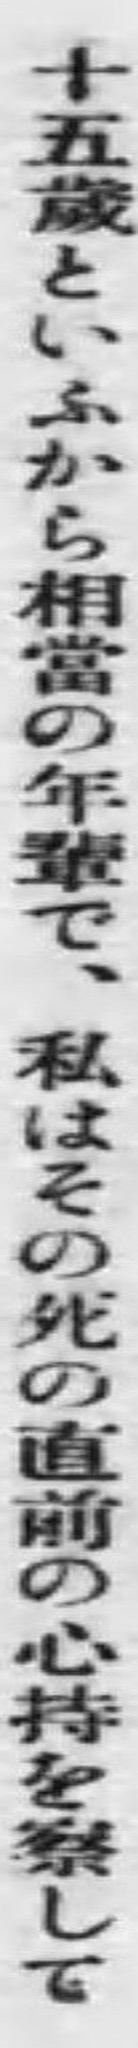十五歳といふから相当の年輩で、私はその死の直前の心持を察して
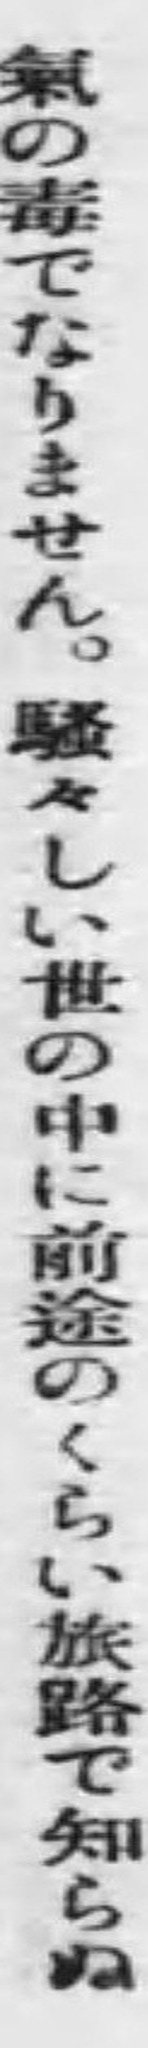気の毒でなりません。騒々しい世の中に前途のくらい旅路で知らぬ
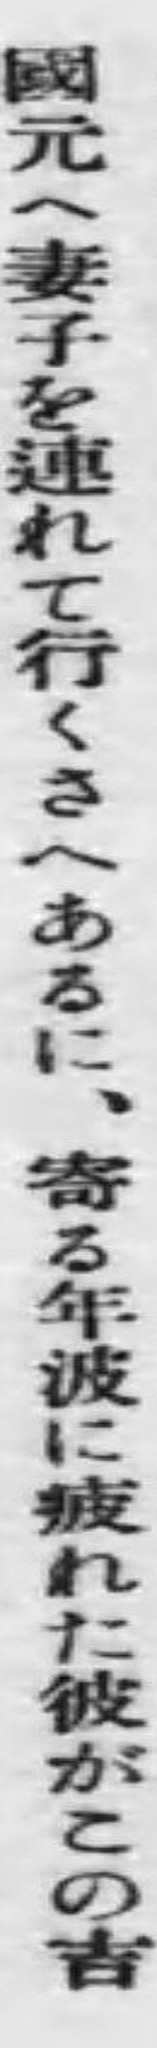国元へ妻子を連れて行くさへあるに、寄る年波に疲れた彼がこの吉
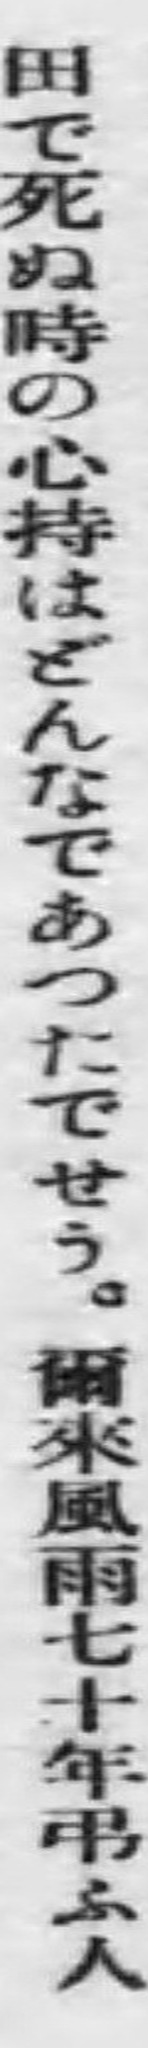田で死ぬ時の心持はどんなであつたでせう。爾来風雨七十年弔ふ人
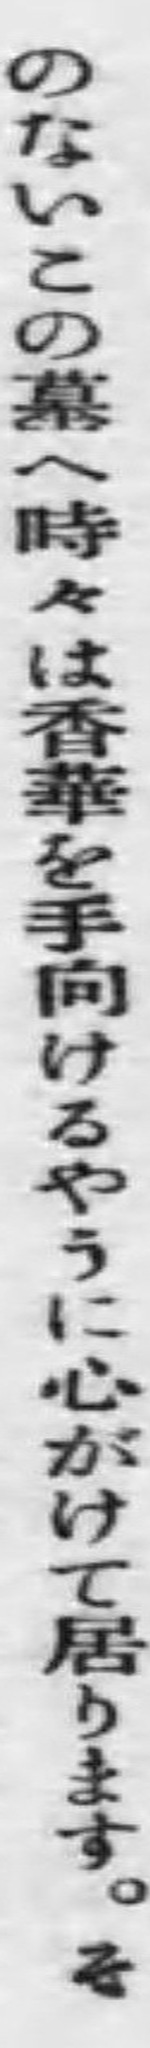のないこの墓へ時々は香華を手向けるやうに心がけて居ります。そ
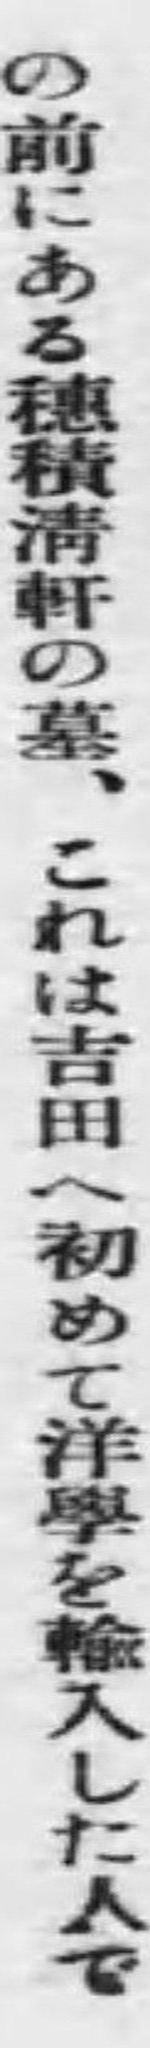の前にある穂積清軒の墓、これは吉田へ初めて洋学を輸入した人で
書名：東三河道中記 : 豊橋市及其附近案内
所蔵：国立国会図書館 National Diet Library, JAPAN
